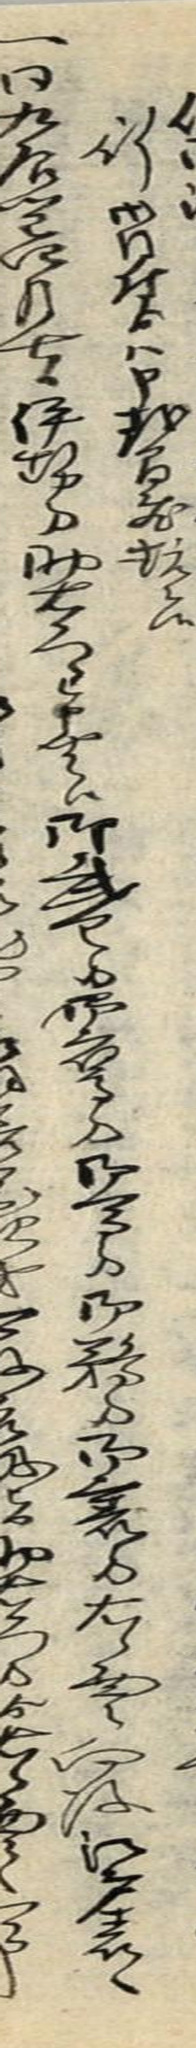一同九辰閏四月七日伊勢方助右衛門へ被申聞候は御武具方御鷹方御馬方御鵜方御裏方右之面々向後江戸表へ
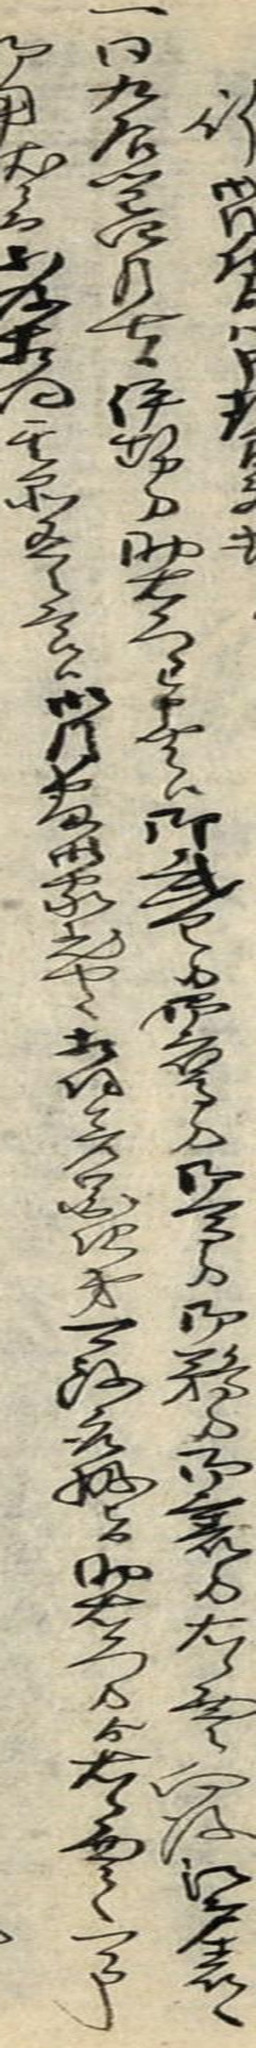御用状に而不及相伺其品有之節は御月番御家老中へ相伺差図次第可致取扱旨助右衛門方ゟ右之面々へ可申
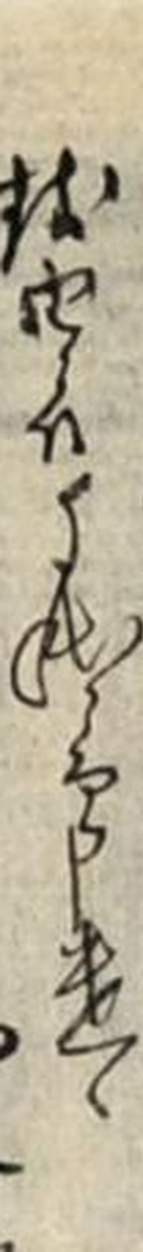越由に付手紙に而申遣候
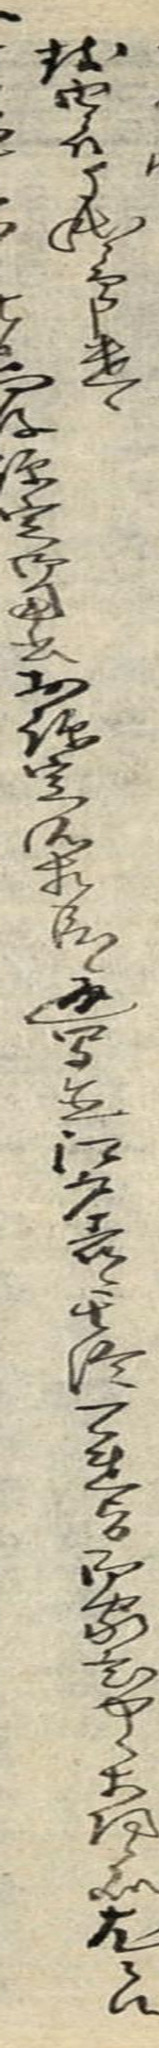一享保十巳五月廿日向後評定御用書於評定所相渡候通写置江戸表へ其侭可達旨御家老中へ相伺候処尤に候
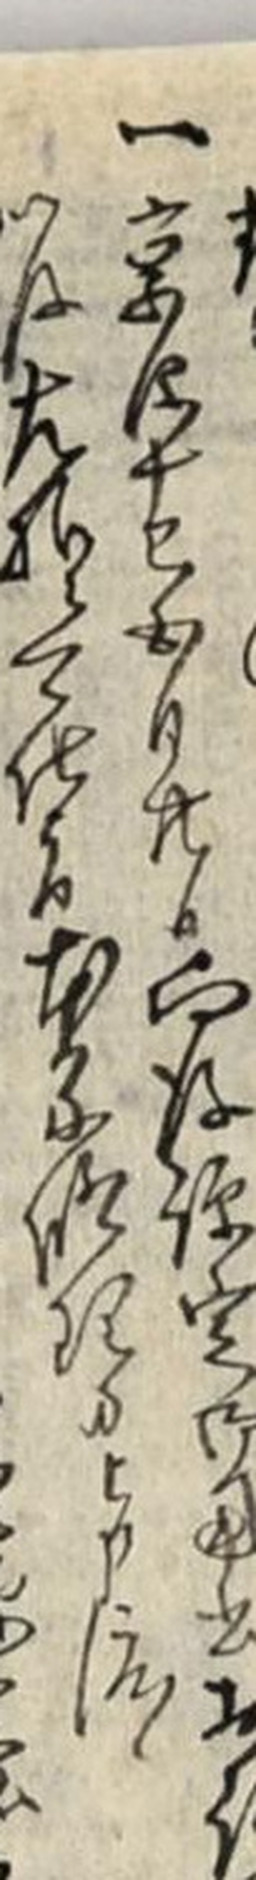以後左様に可仕旨本多修理方被申渡候
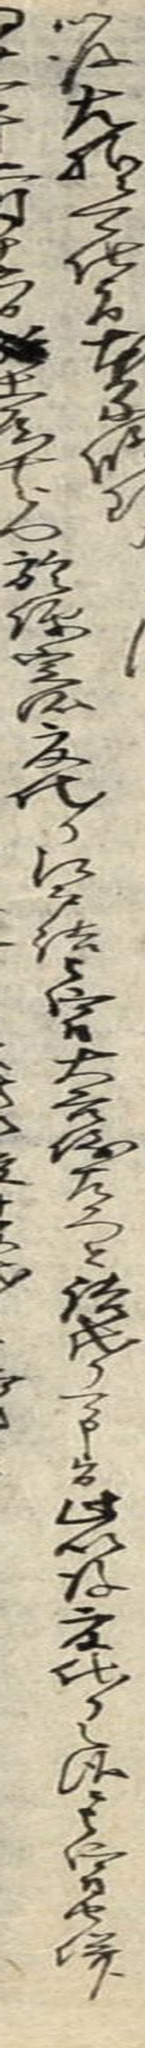一同十一午二月十六日土屋十郎右衛門於評定所夏代り江戸詰被仰付大谷儀左衛門と詰代り可申旨此以後夏代り之趣に被仰付候由併
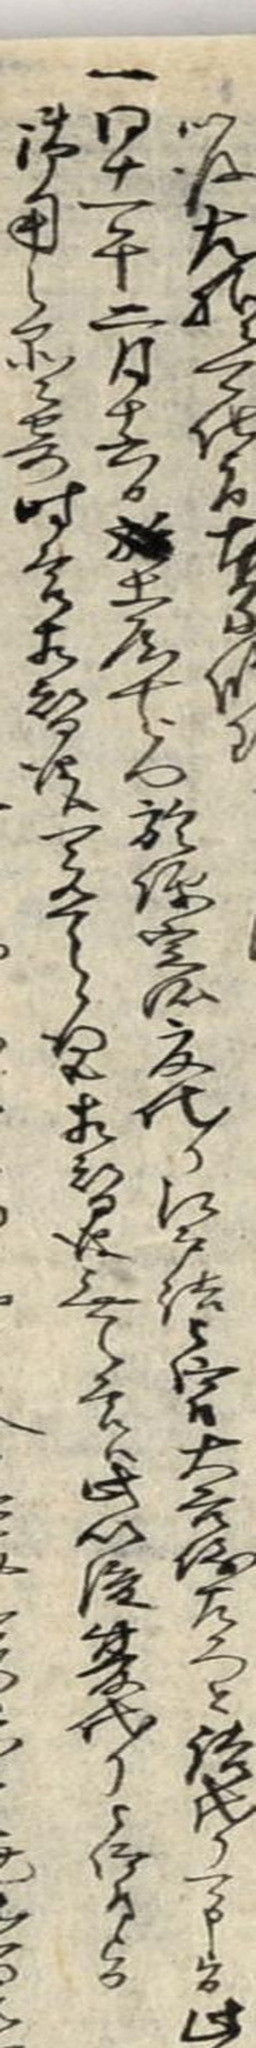御用之品に寄時節相替儀は可有之候得共相替儀無之節は此以後夏代り被仰付候旨
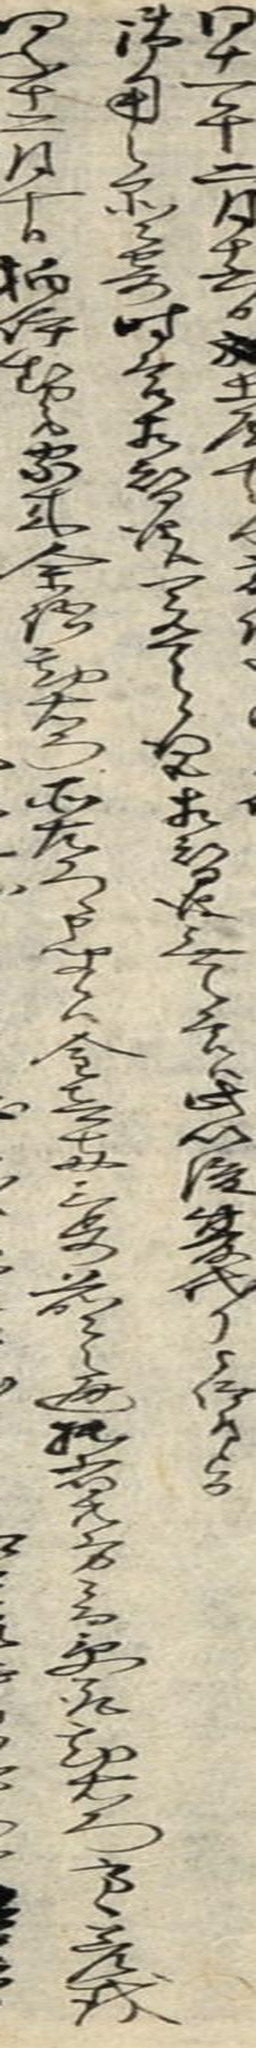一同年十二月十日狛伊勢方家来余語勘右衛門所左衛門へ申聞候は金壱両三歩前々之通拙者方に而受取勘右衛門方へ差越
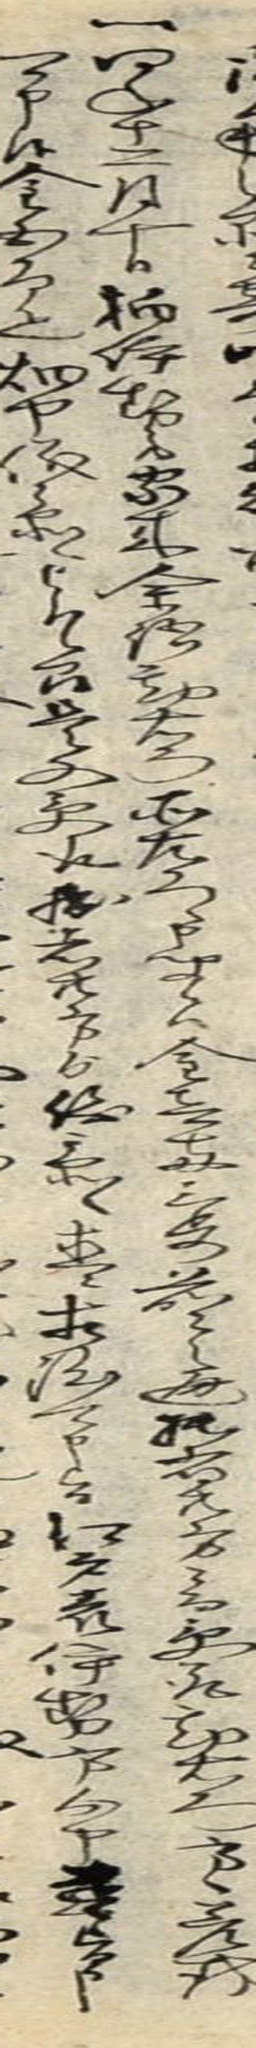可申候金五百疋畑中儀兵衛へ被下候間是又受取拙者共方ゟ儀兵衛へ直々相渡可申旨江戸表伊勢方ゟ申遣候旨申
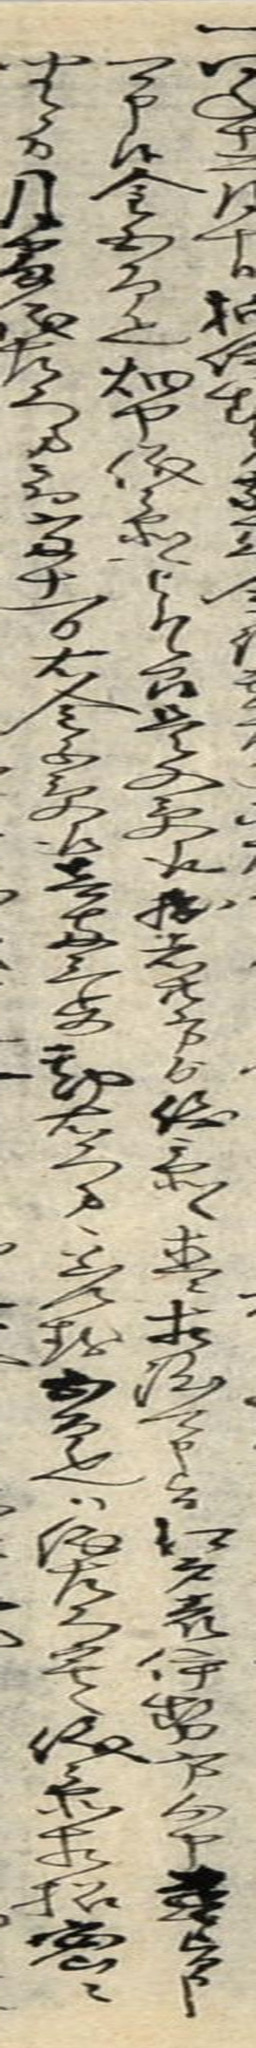聞候に付月番儀左衛門方に而当十一日右金子受取壱両三歩勘右衛門方へ差越五百疋は儀左衛門宅へ儀兵衛相招密に
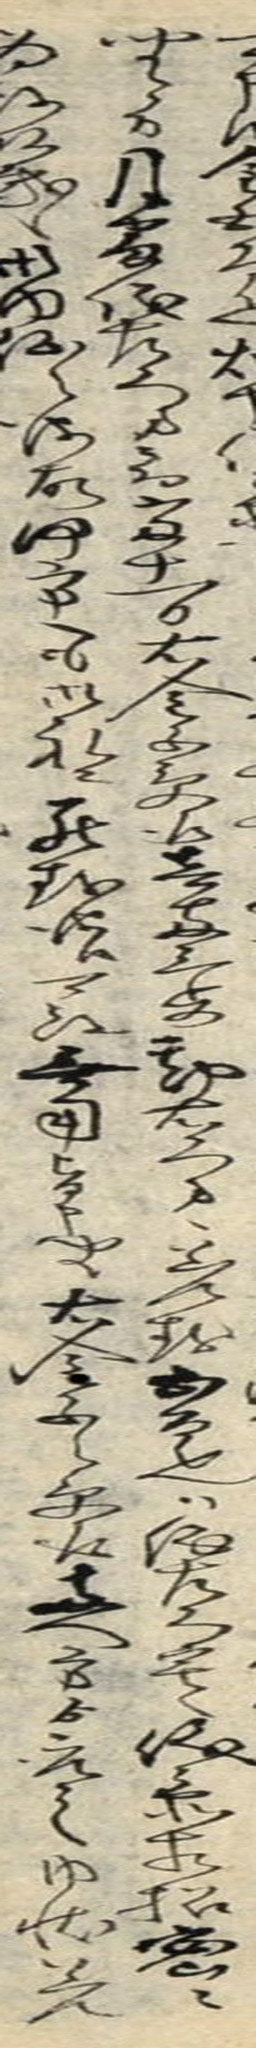為致頂戴候御内証之儀故何方へも御礼に罷越儀は可致無用旨申聞候右金子之受取両人方ゟ取之内状差
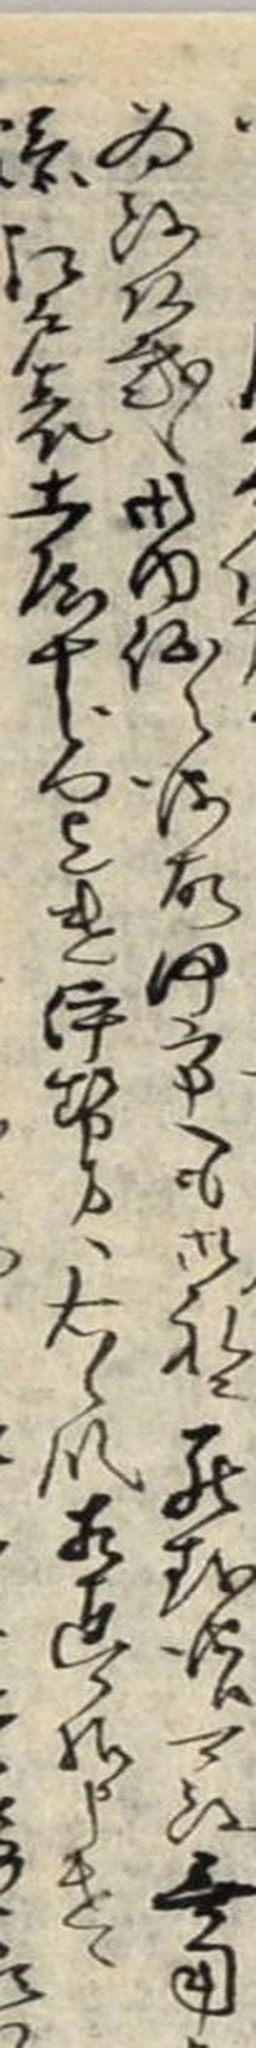添江戸表土屋十郎右衛門迄遣伊勢方へ右之段相達候様申遣候
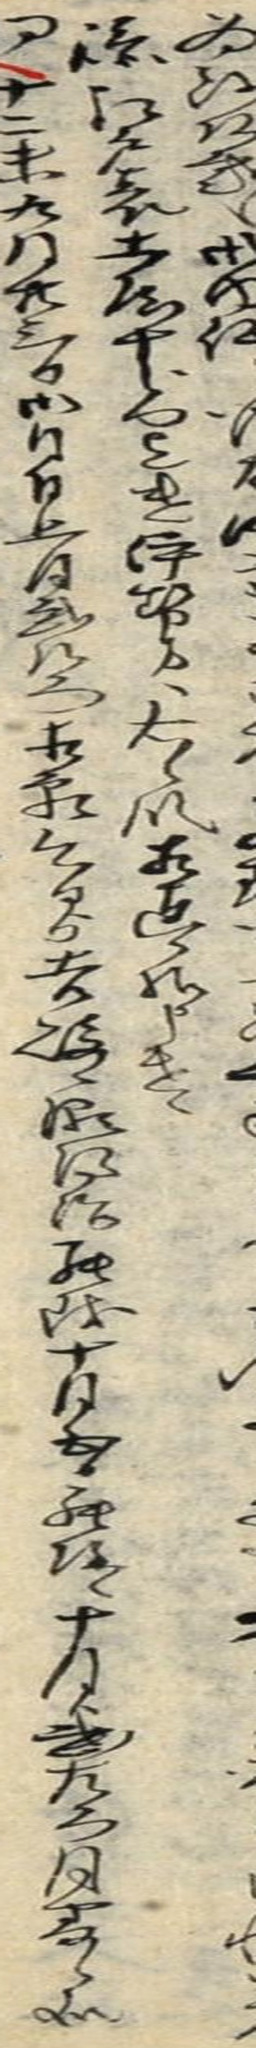一同十二未九月廿三日御目付上月武左衛門相願今日ゟ吉崎へ潮湯治罷越十月五日罷帰候十月は武左衛門月番之処
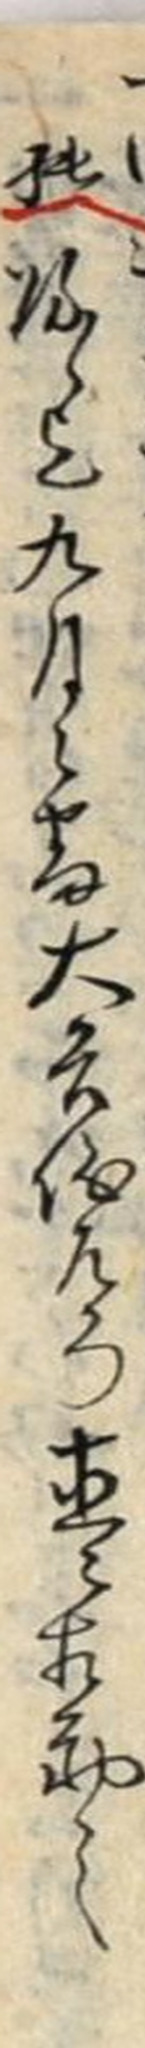罷帰候迄九月之番大谷儀左衛門直々相勤之

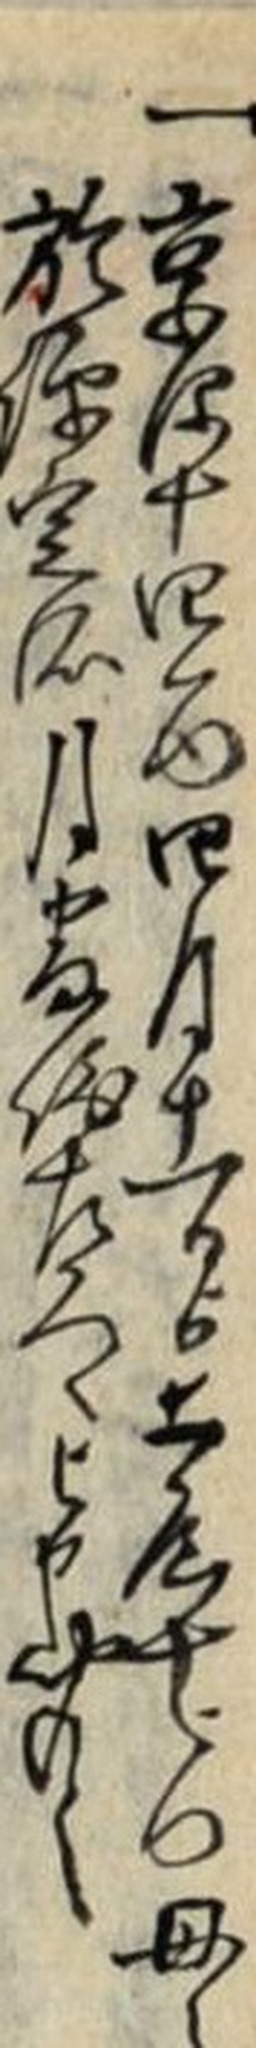於評定所月番儀左衛門へ被申聞之
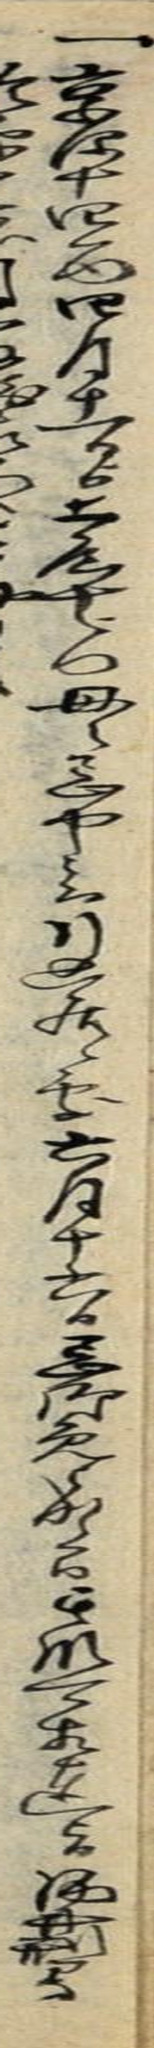一享保十四酉四月十一日ゟ土屋十郎右衛門母之忌中に而引込居候処六月十六日忌御免に成候間其段可相達旨酒井刑部
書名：蒐輯之部
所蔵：福井県文書館 Fukui Prefectural Archives
